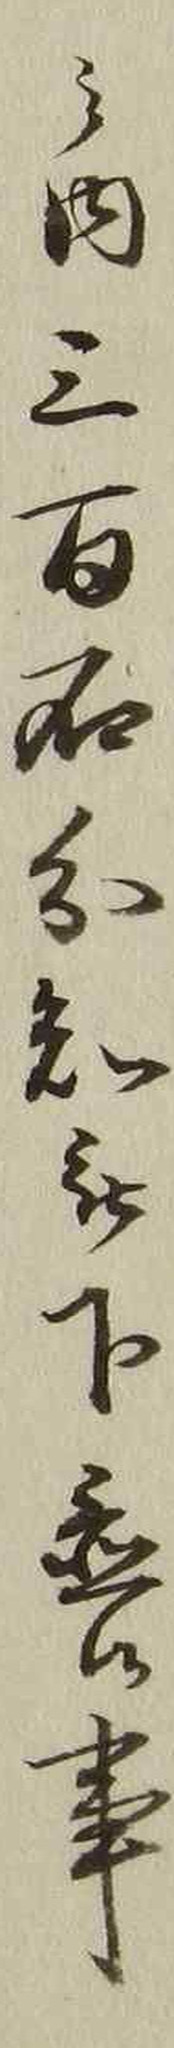之内三百石分知被下置候事
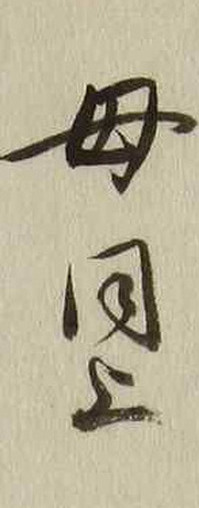母同上
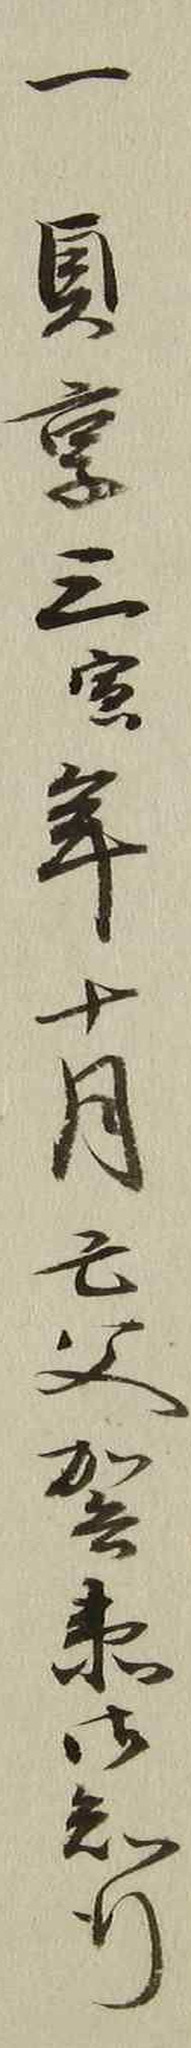一貞享三寅年十月亡父加兵衛御知行
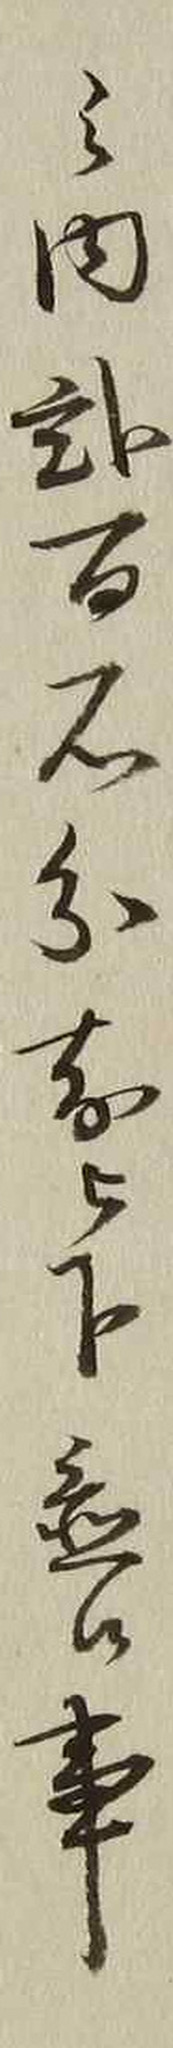之内弐百石分知被下置候事
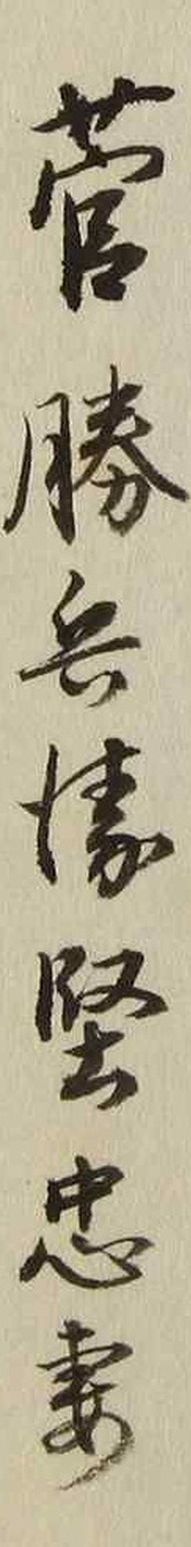女管勝兵衛堅忠妻
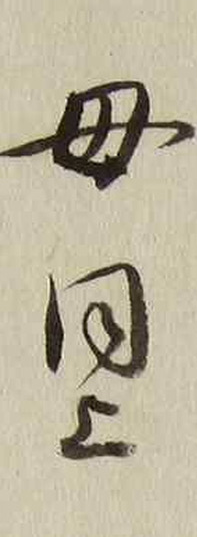母同上
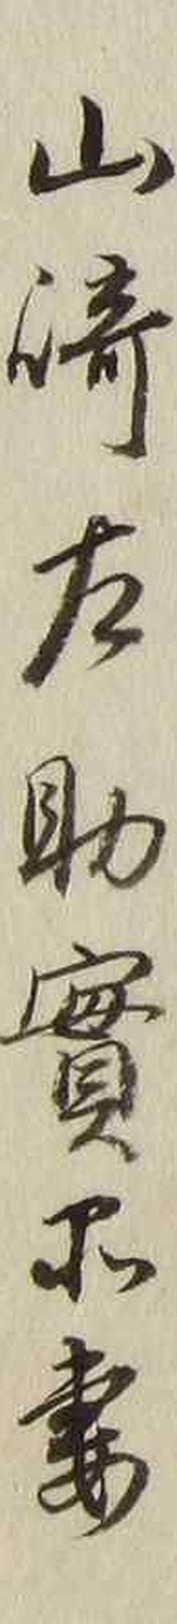山崎左助実品妻
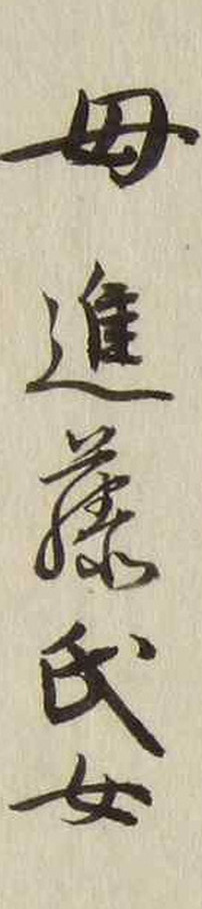母進藤氏女

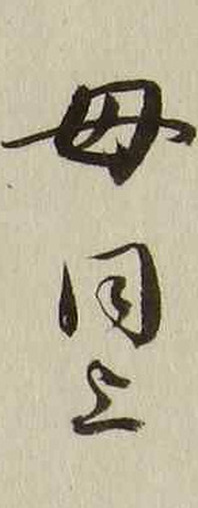母同上
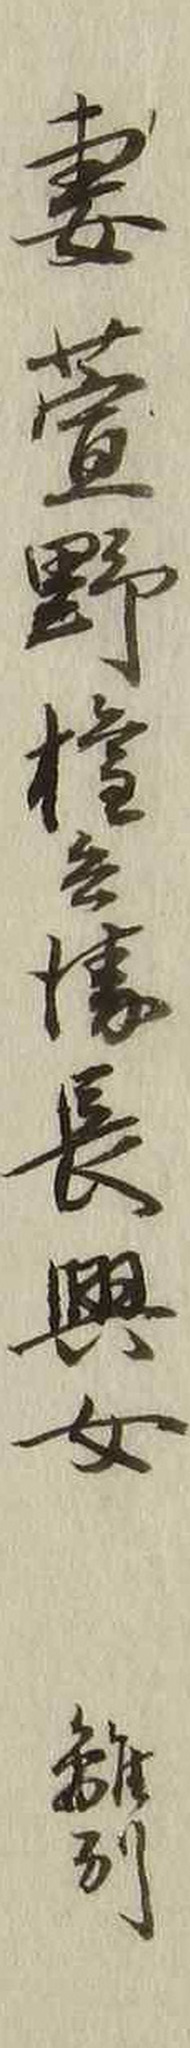妻萱野権兵衛長興女離別
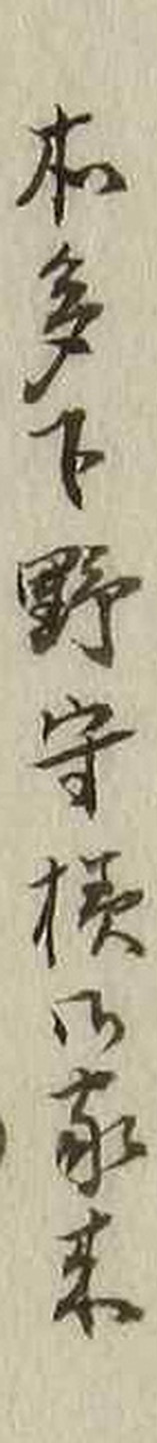本多下野守様御家来
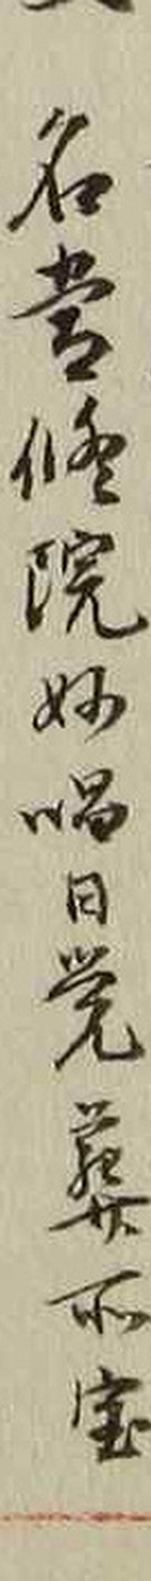名常修院妙唱日覚葬所宝
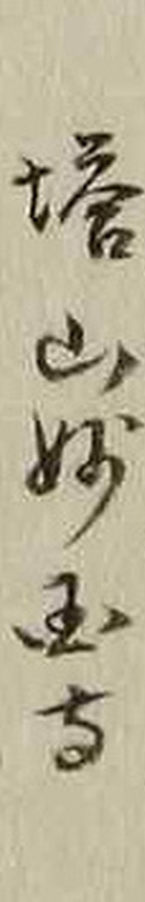塔山妙国寺
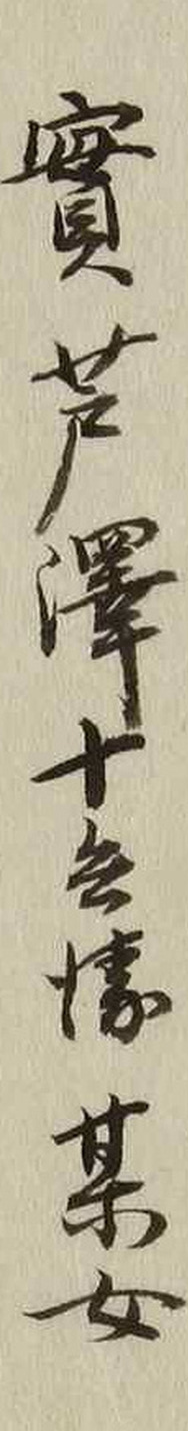実芦沢十兵衛某女
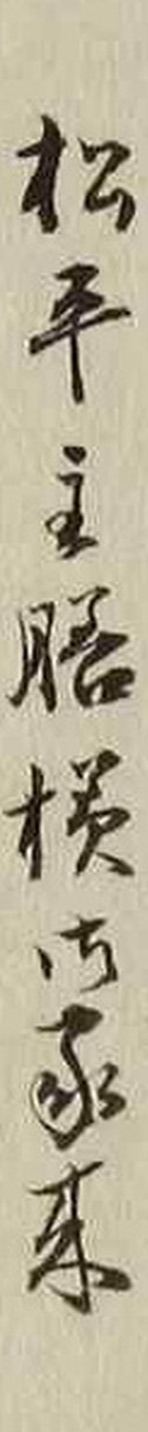松平主膳様御家来
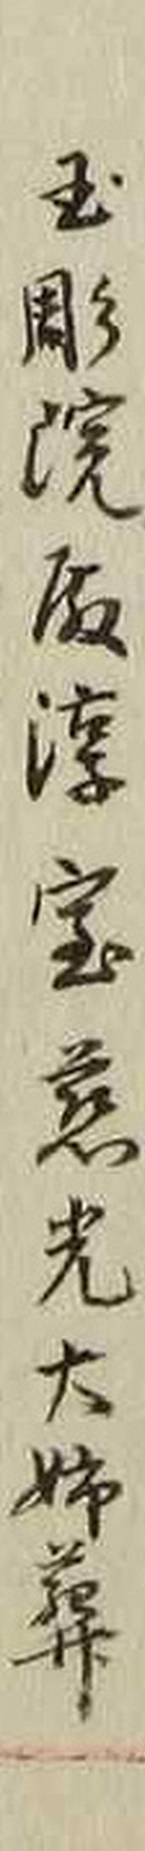玉彫院殿淳宝慈光大姉葬
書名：諸士系譜　巻之125　た之部1
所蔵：会津若松市立会津図書館
